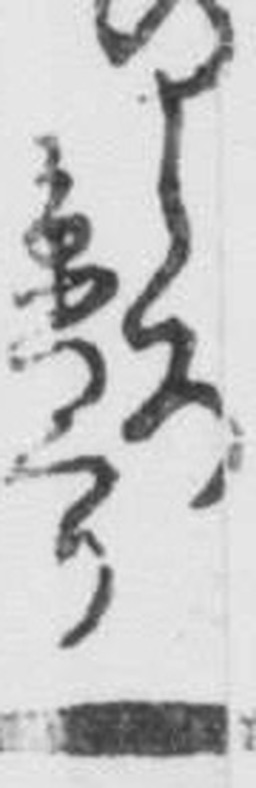糸つくり
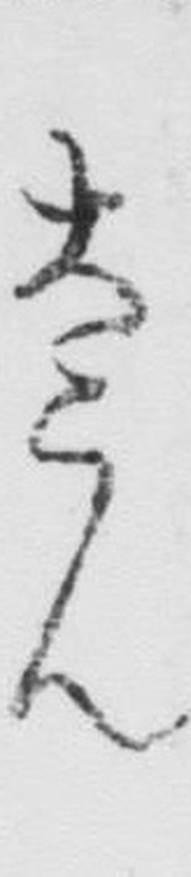大こん
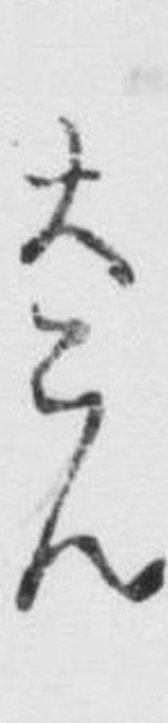大こん
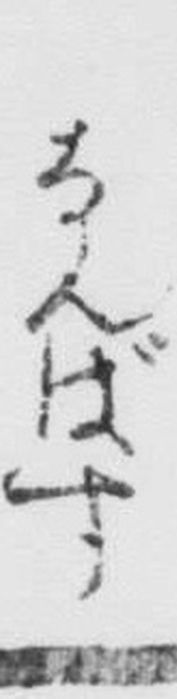なんばす
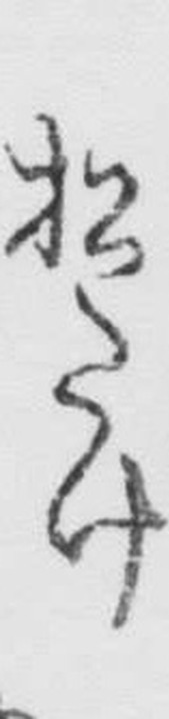松たけ
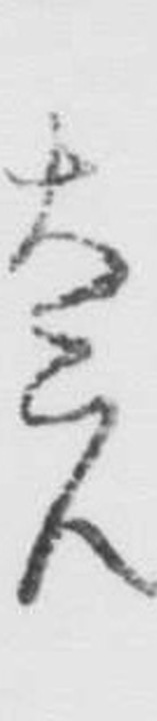大こん
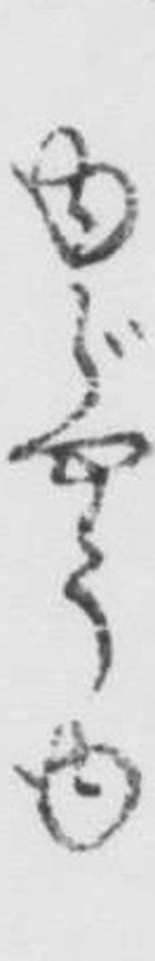ゆじやうゆ
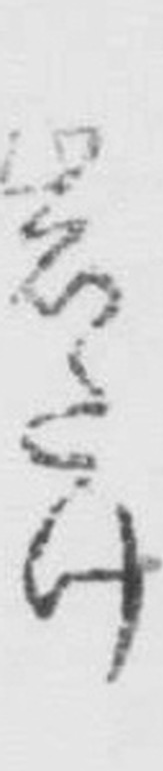岩たけ
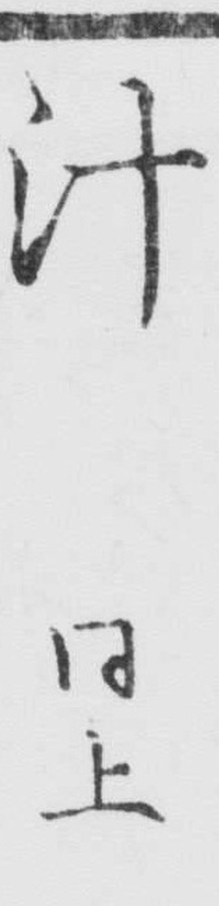汁同上
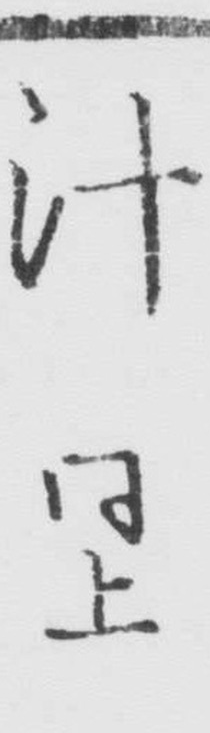汁同上
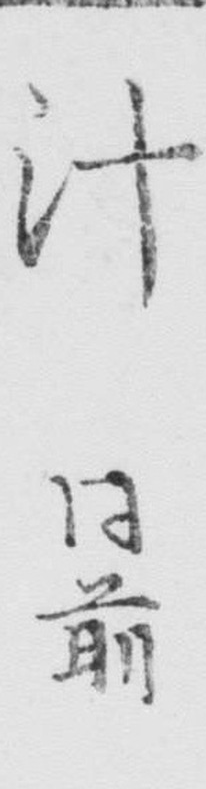汁同前
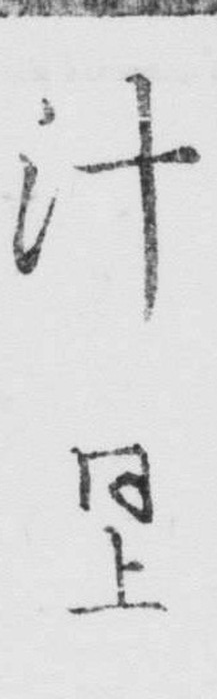汁同上
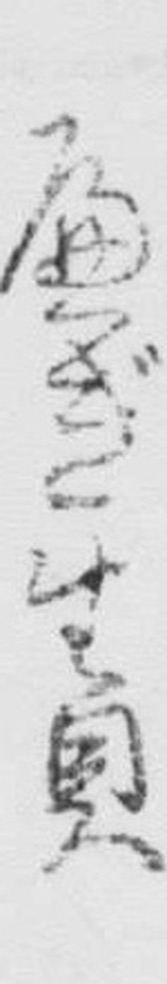へぎ生貝
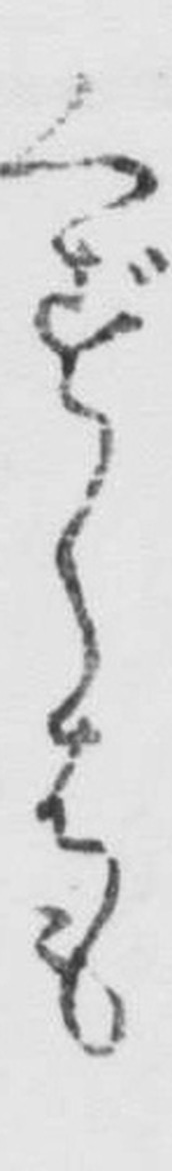くずしはも
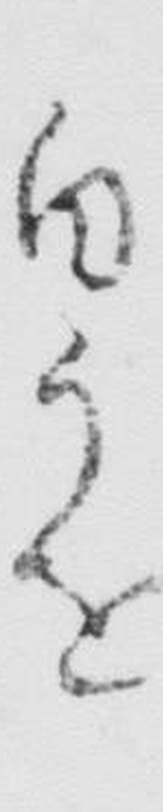白うを
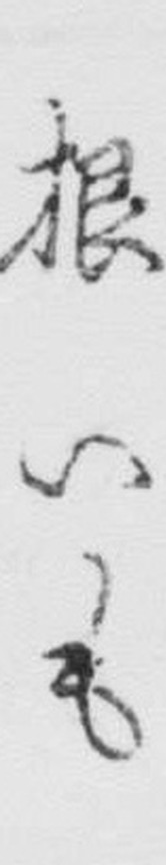根いも
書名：諸家通用/即席料理
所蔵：大阪府立大学学術情報センター 国文学研究資料館
